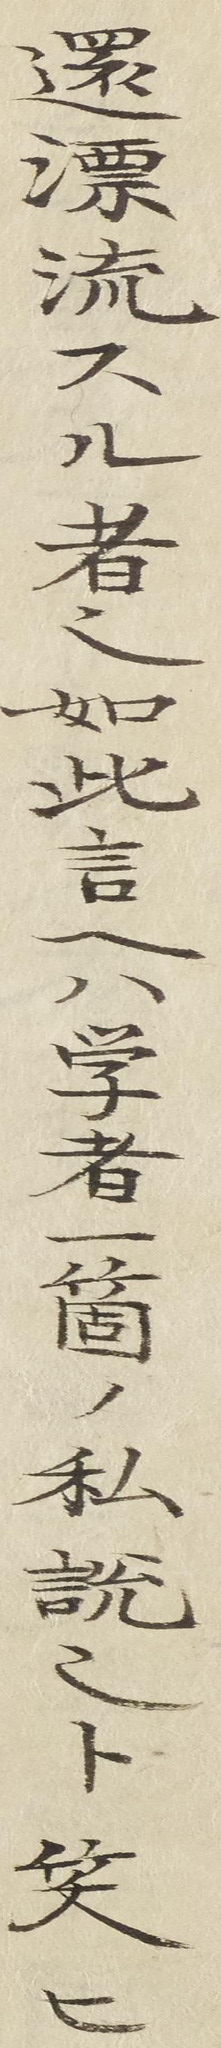還漂流する者也如此言へは学者一箇の私説也と笑ひ
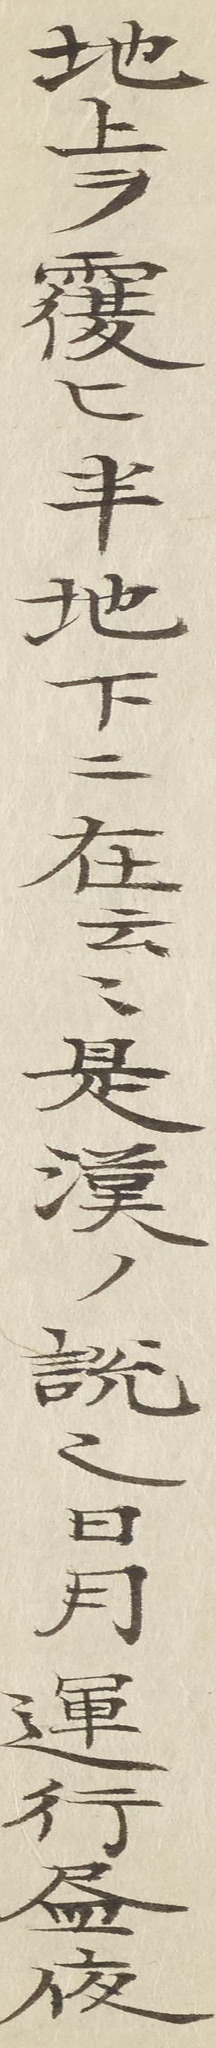地を覆ひ半地下に在云々是漢の説也日月運行昼夜
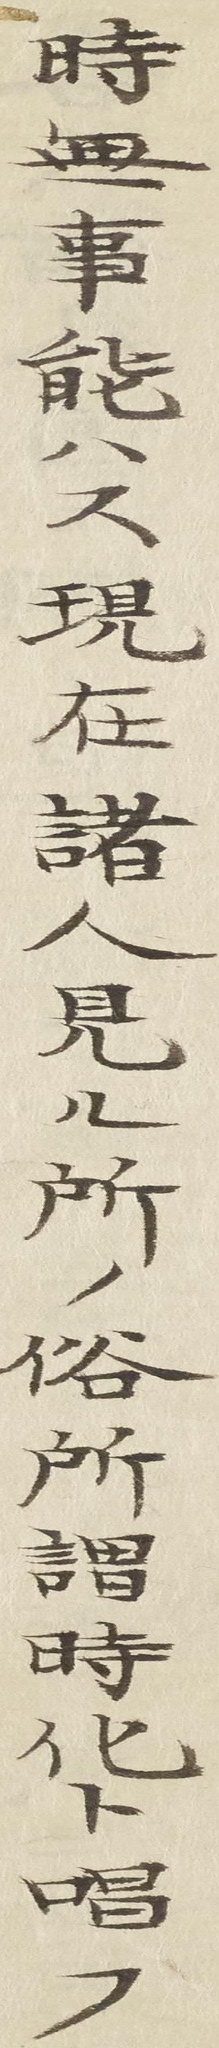時無事能はす現在諸人見る所の俗所謂時化と唱ふ
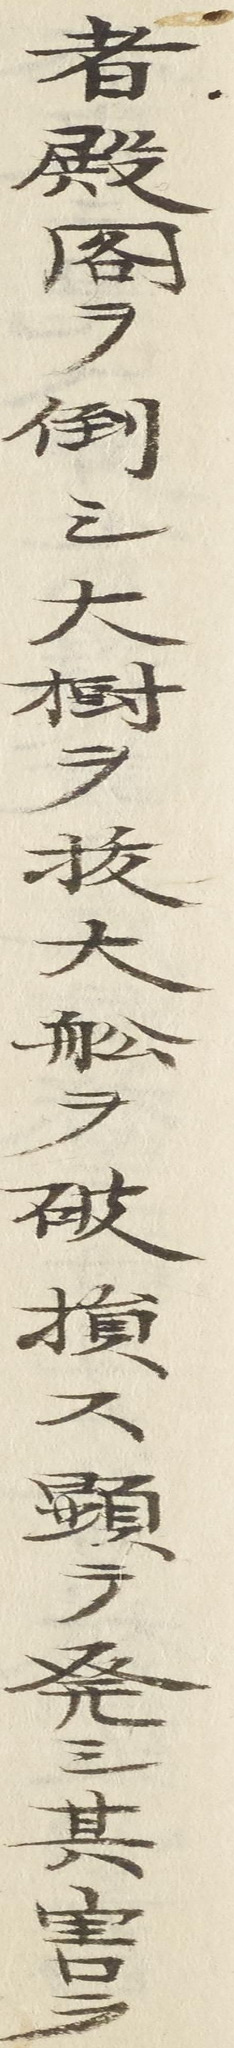者殿閣を倒し大樹を抜大船を破損す顕て発し其害を
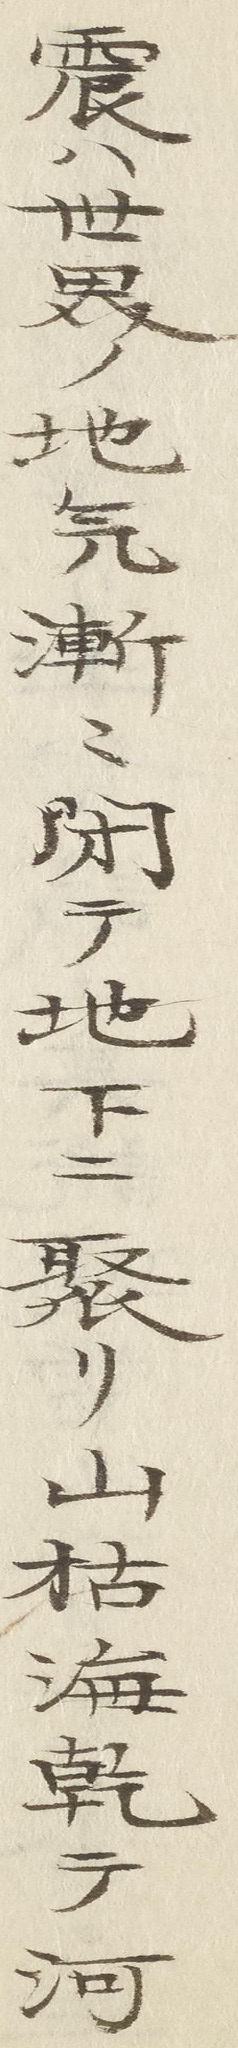震は世界の地気漸々閉て地下に聚り山枯海乾て河
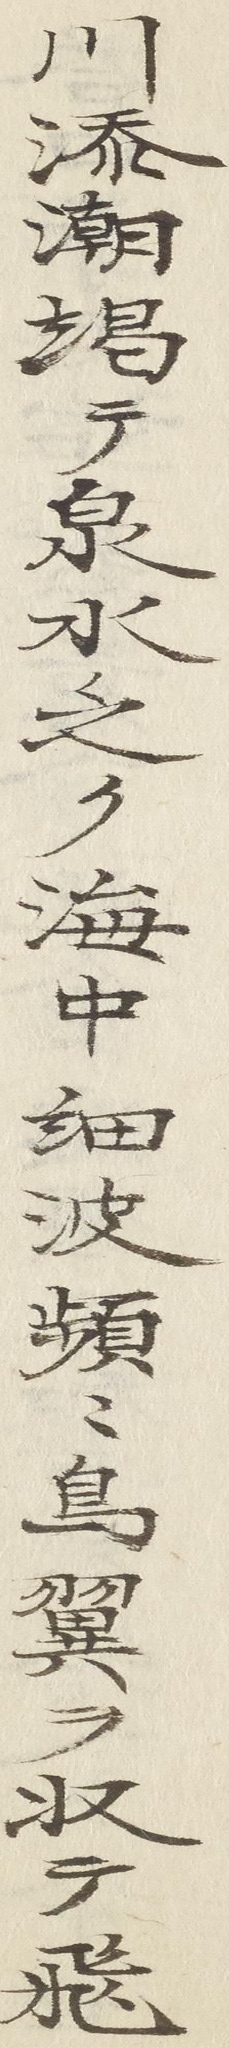川添潮竭て泉水乏く懐中細波頻々鳥翼を収て飛
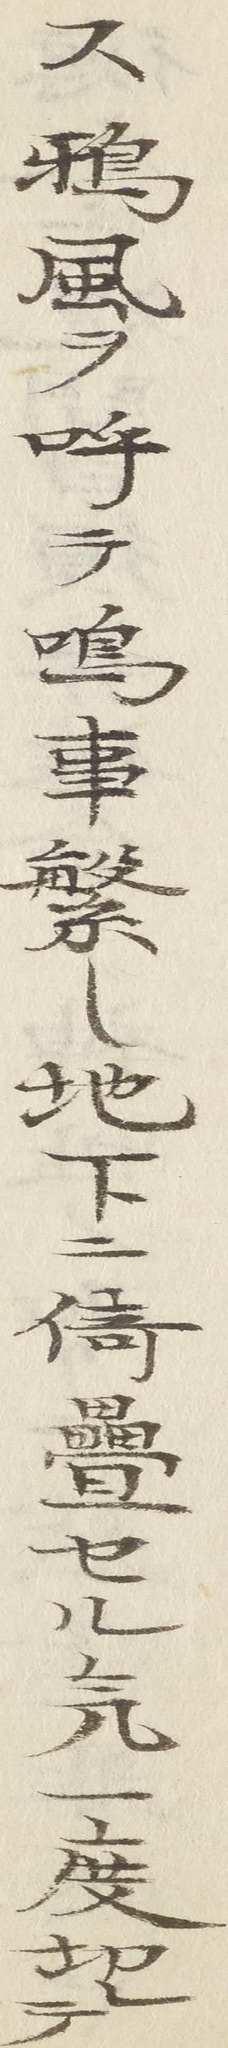す鴉風を呼て鳴事繁し地下に倚畳せる気一度切れて
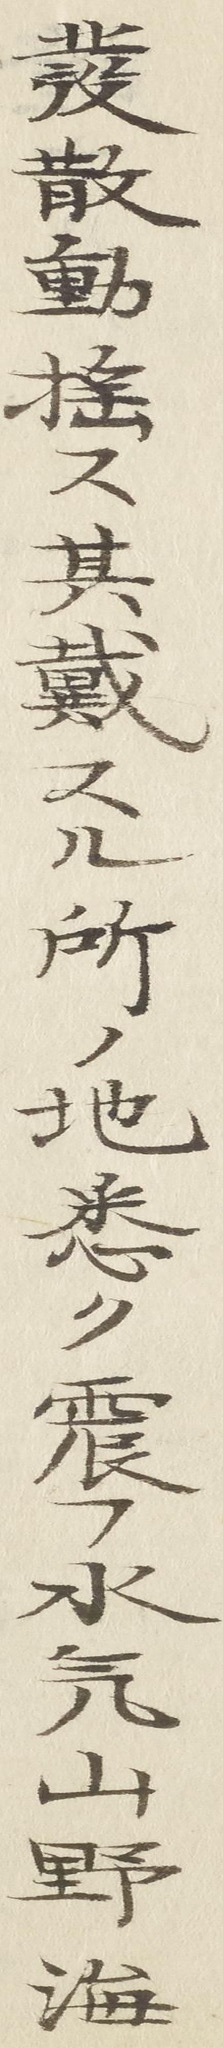発散動揺す其載する所の地悉く震ふ水気山野海
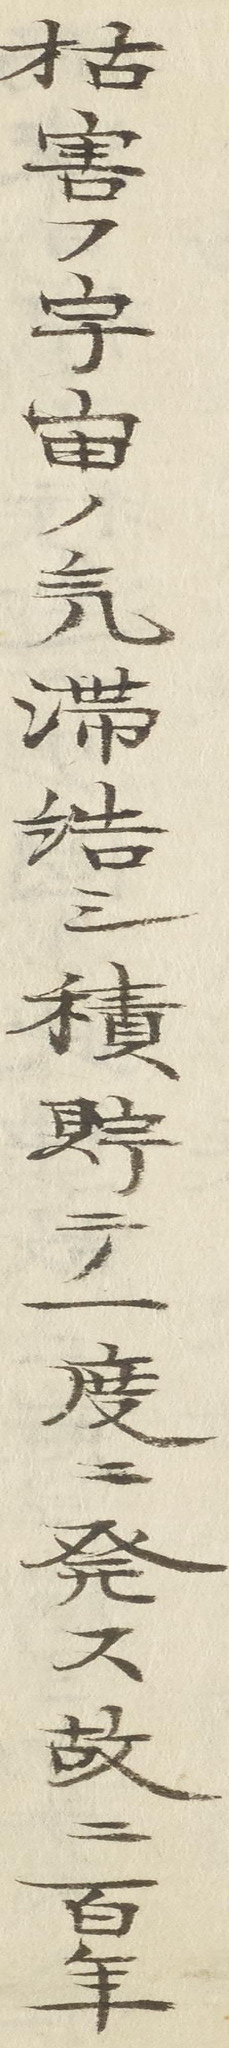枯害ふ宇宙の気滞結し積貯て一度に発す故に百年
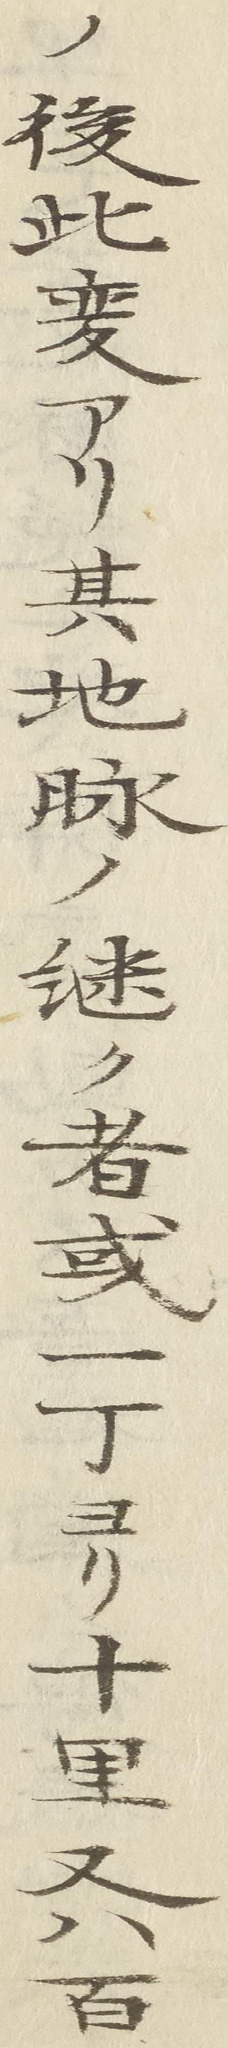の後此変あり其地脈の継く者或一丁より十里又は百

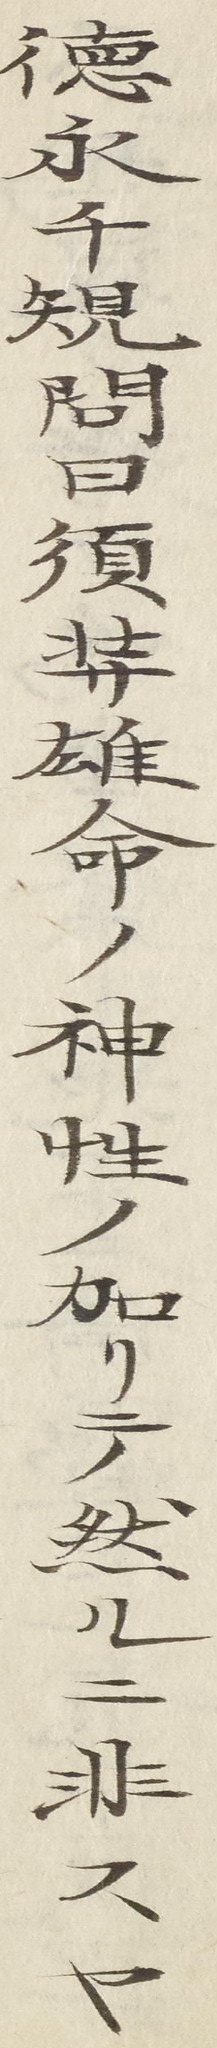徳永千規問曰須弉雄命の神性の加りて然るに非すや
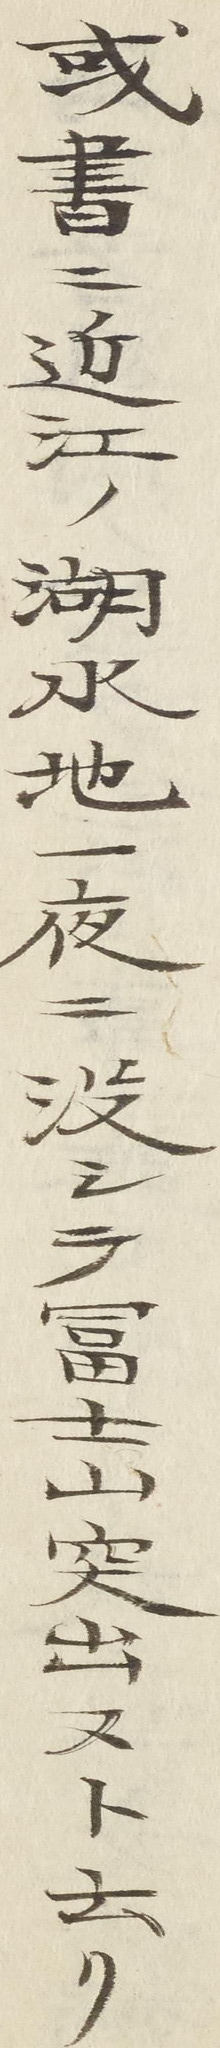或書に近江の湖水地一夜に没して冨士山突出すと云り
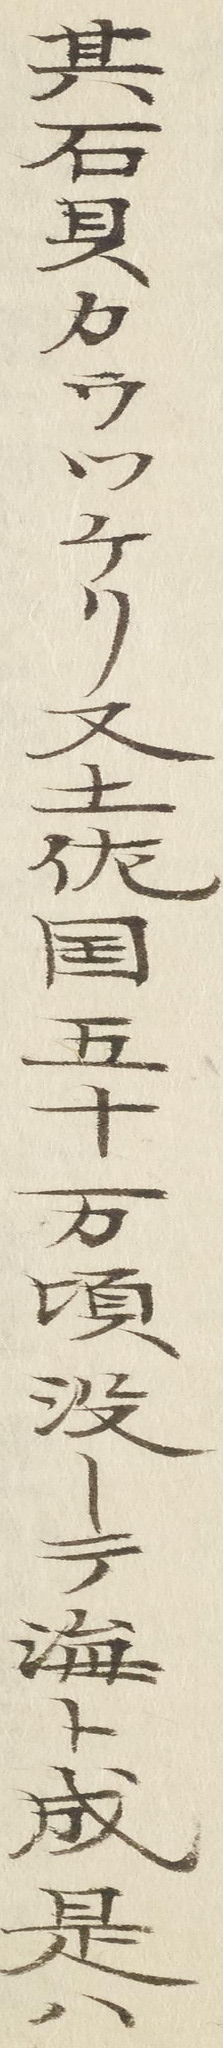其石貝かうつけり又土佐国五十万頃没して海と成是は
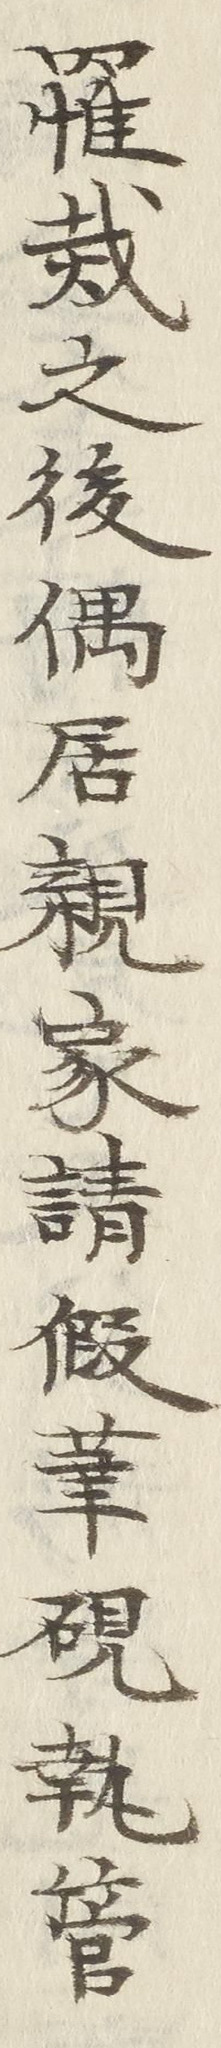罹烖の後寓居親家請假筆硯執管
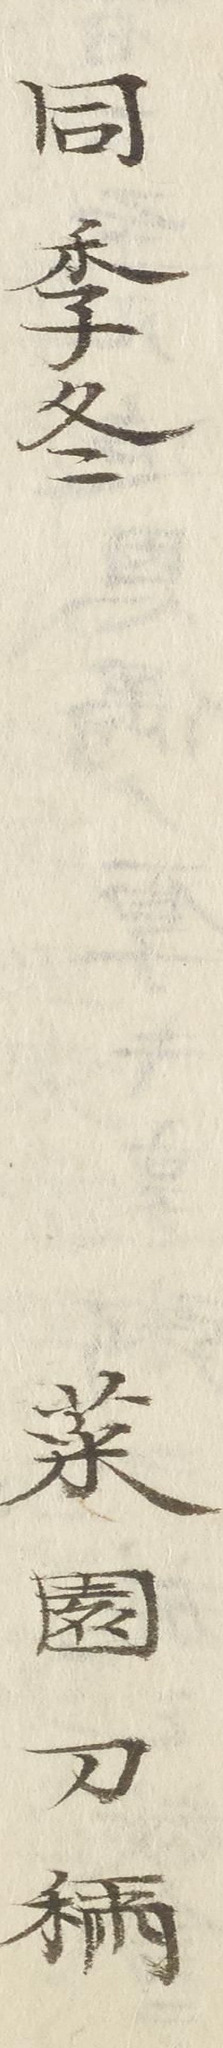同季冬菜園刀禰
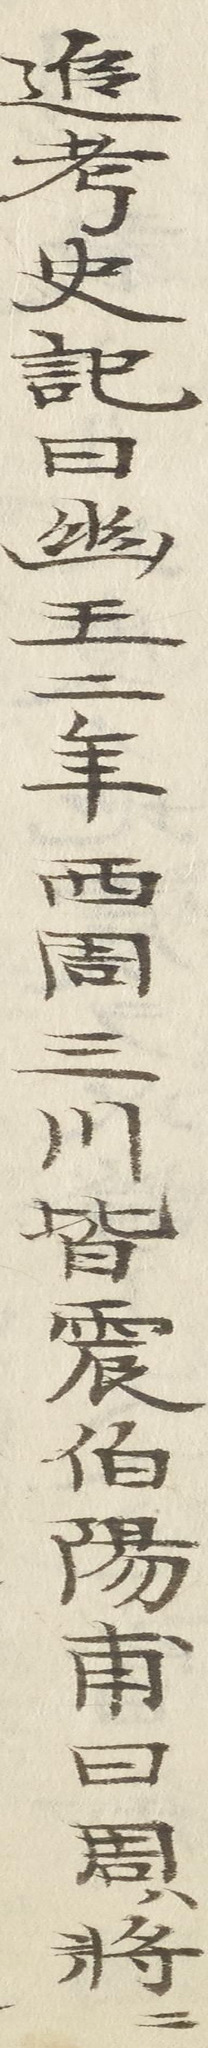追考史記曰幽王二年西周三川皆震伯陽甫曰周は将に
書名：地震記　下
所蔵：東京大学地震研究所図書室 Earthquake Research Institute Library, The University of Tokyo, JAPAN
